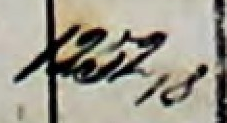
1252,8
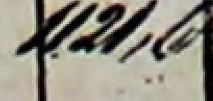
1121,6
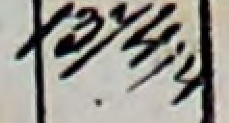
1374,4
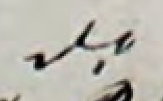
Do
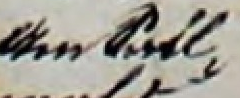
Am S???l„
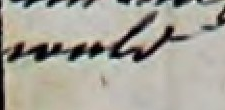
wald
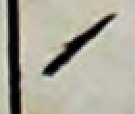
1
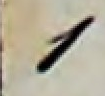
1
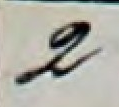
2
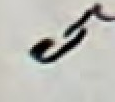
5
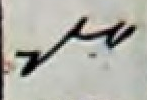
Do
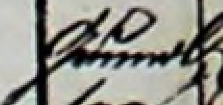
Grund
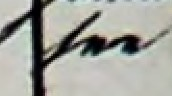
see
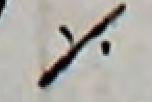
./.
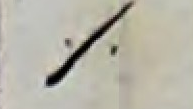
./.
